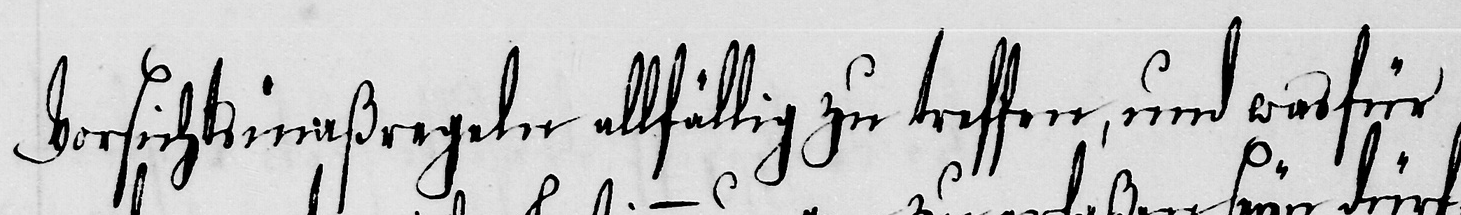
Vorsichtsmaßregeln allfällig zu treffen, und was für
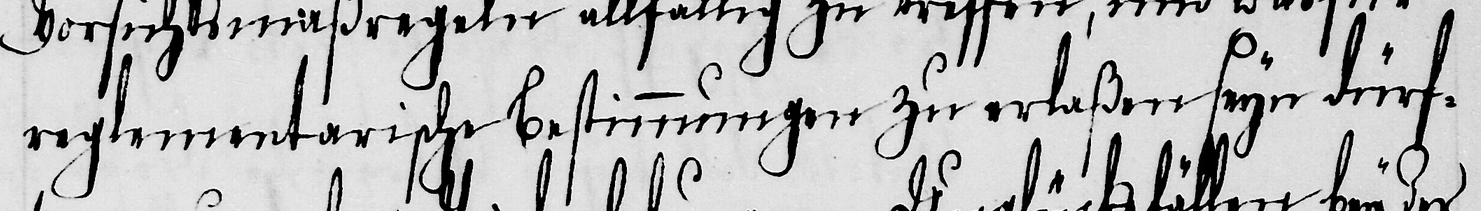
reglementarische Bestimmungen zu erlaßen seyn dürf¬
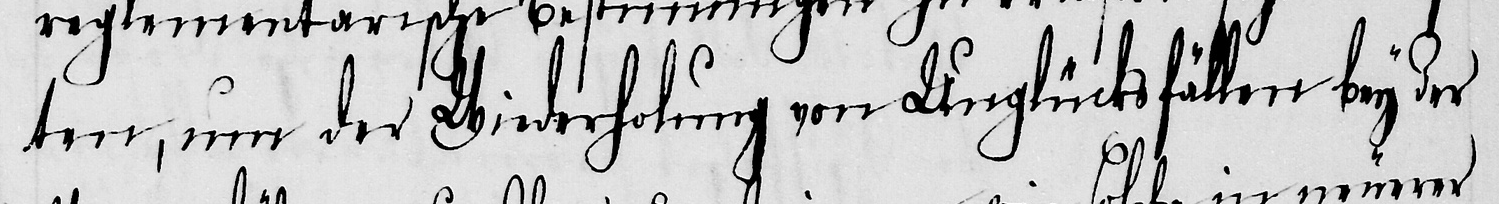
ten, um der Wiederholung von Unglücksfällen bey der
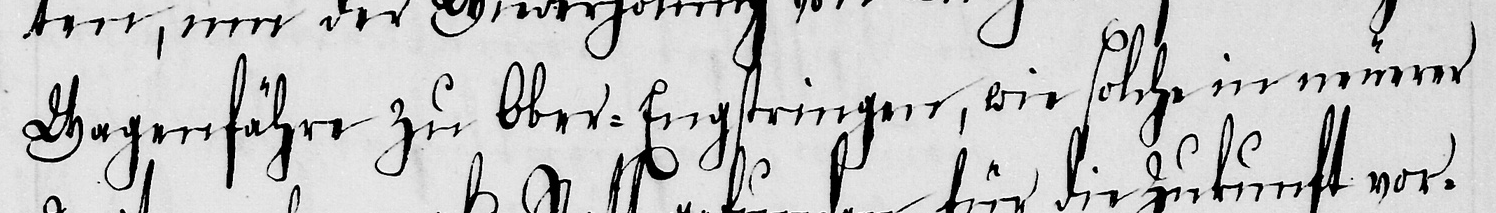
Wagenfähre zu Ober-Engstringen, wie solche in neuerer
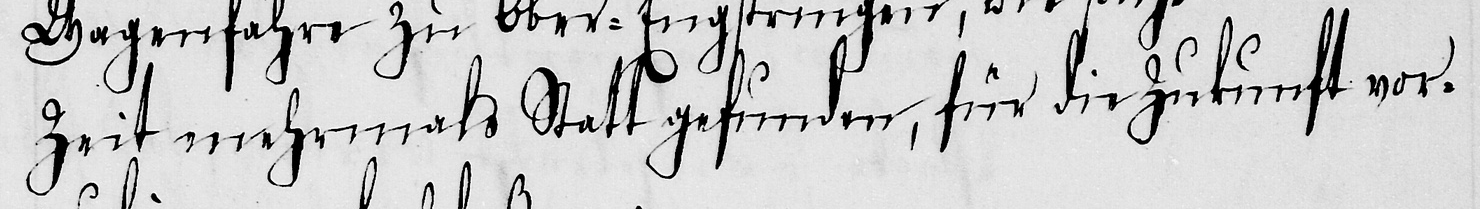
Zeit mehrmals Statt gefunden, für die Zukunft vor¬
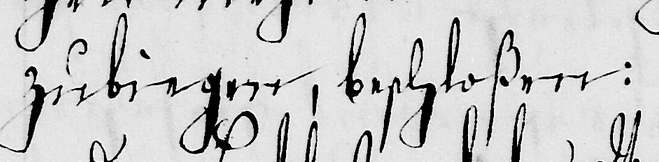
zubiegen, beschloßen:
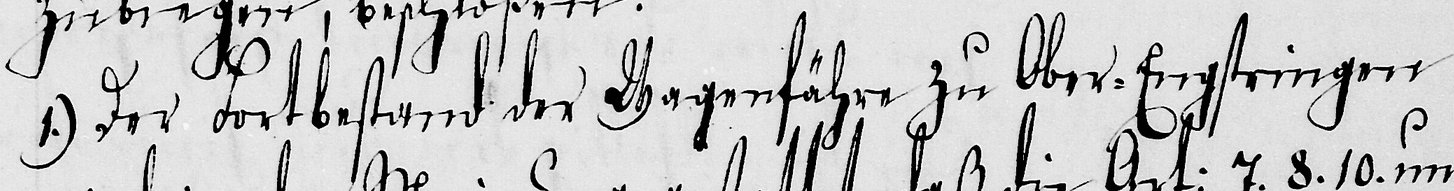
1.) Der Fortbestand der Wagenfähre zu Ober-Engstringen
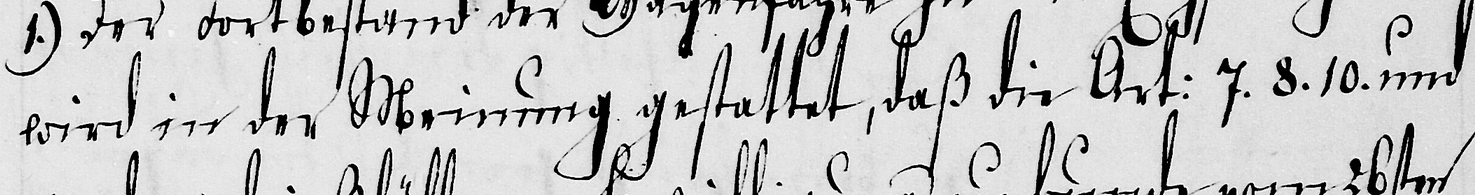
wird in der Meinung gestattet, daß die Art: 7. 8. 10. und
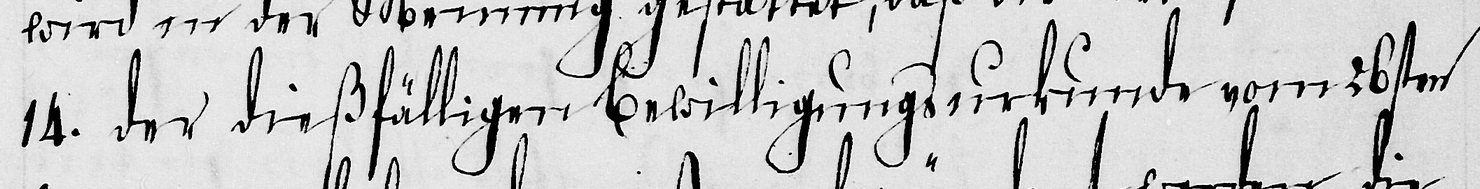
14. der dießfälligen Bewilligungsurkunde vom 26sten
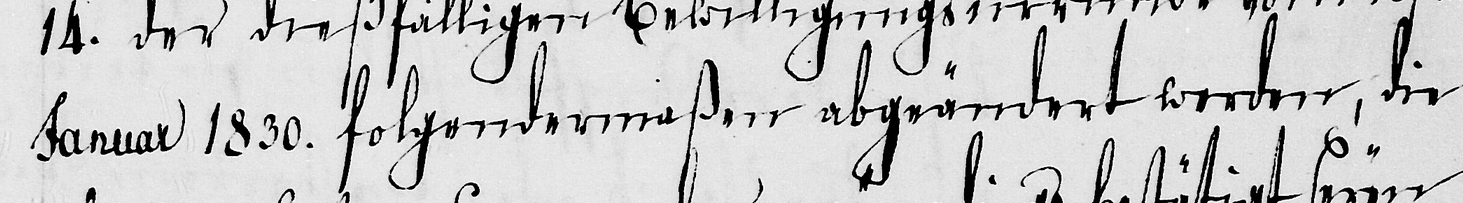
Januar 1830. folgendermaßen abgeändert werden, die
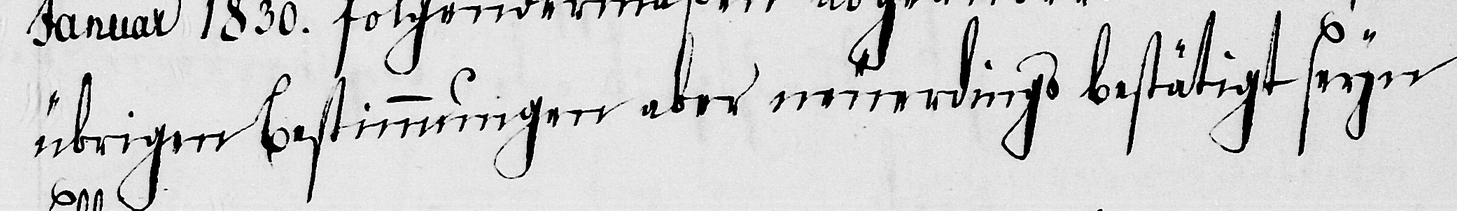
übrigen Bestimmungen aber neuerdings bestätigt seyn
